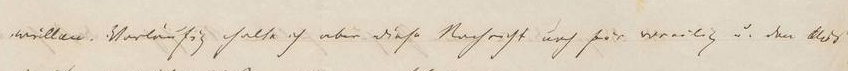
willen. Vorläufig halte ich aber diese Nachricht noch für voreilig u. den Aus-
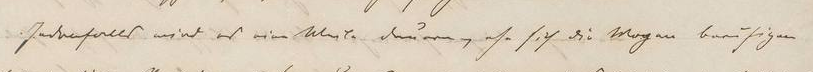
Jedenfalls wird es eine Weile dauern, ehe sich die Wogen beruhigen
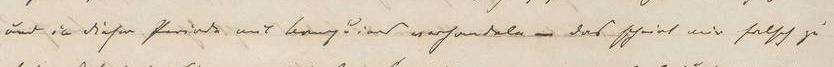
und in dieser Periode mit Banquiers verhandeln – das scheint mir falsch zu
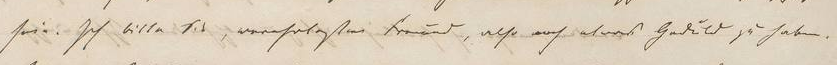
sein. Ich bitte Sie, verehrtester Freund, also noch etwas Geduld zu haben.
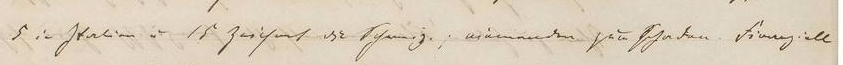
5 in Italien u 15 zeichnet die Schweiz; niemandem zum Schaden. Finanziell
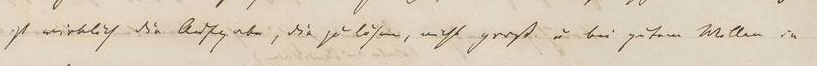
ist wirklich die Aufgabe, die zu lösen, nicht groß u bei gutem Willen in
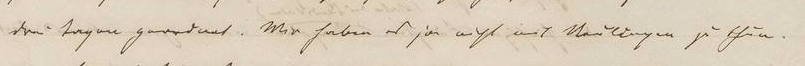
drei Tagen geordnet. Wir haben es ja nicht mit Neulingen zu thun.
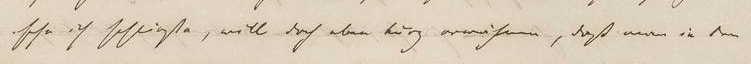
Ehe ich schließe, will doch eben kurz erwähnen, daß man in den
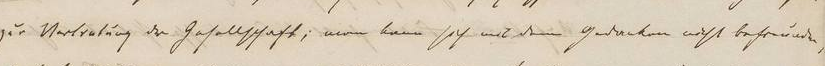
zur Vertretung der Gesellschaft; man kann sich mit dem Gedanken nicht befreunden,
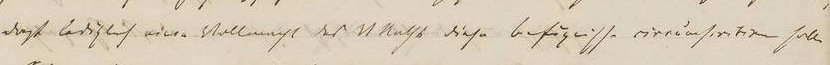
daß lediglich eine Vollmacht des VRaths diese Befugnisse circumscribiren solle.
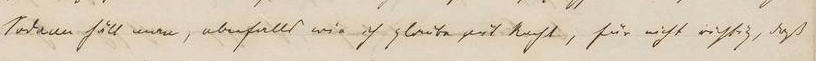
Sodann hält man, ebenfalls wie ich glaube mit Recht, für nicht richtig, daß
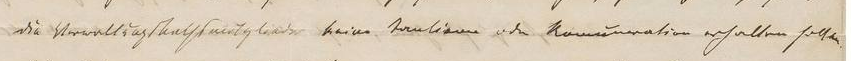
die VerwaltungsRathsmitglieder keine Tantieme oder Remuneration erhalten sollen.
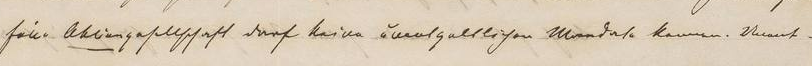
Eine Aktiengesellschaft darf keine unentgeltlichen Mandate kennen. Unent-
